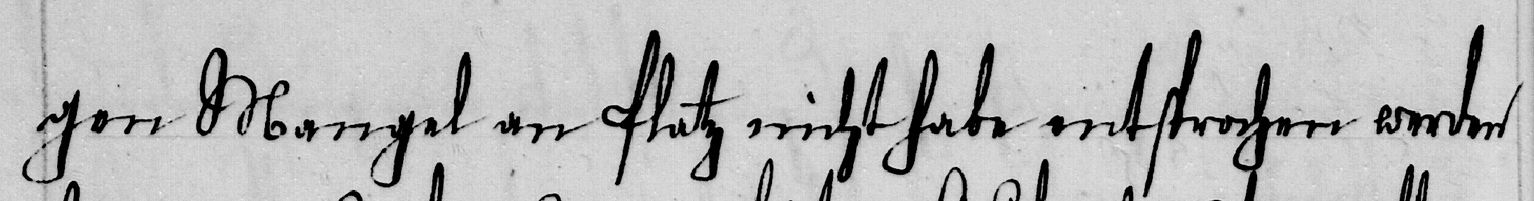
gen Mangel an Platz nicht habe entsprochen werden
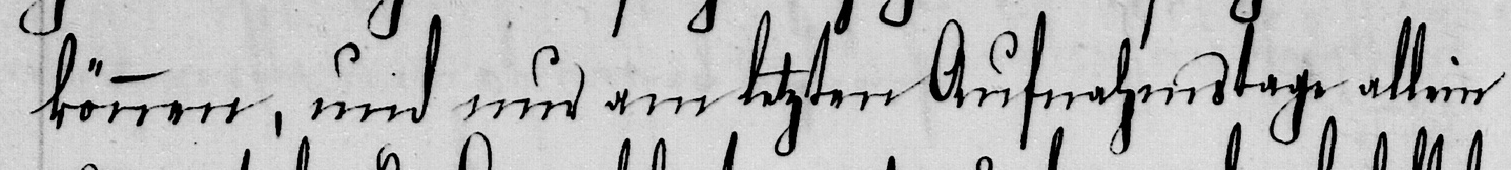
können, und nur am letzten Aufnahmstage allein
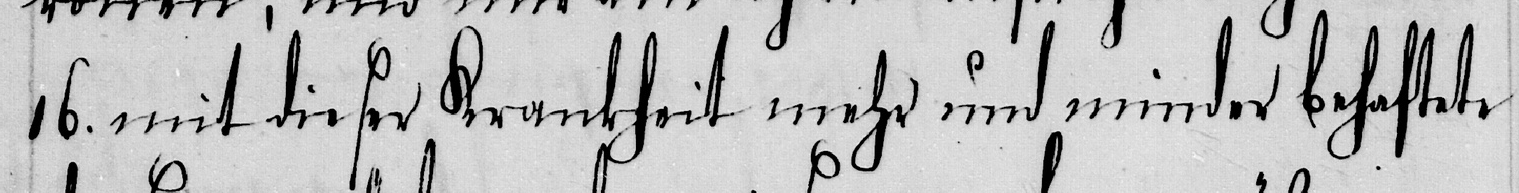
16. mit dieser Krankheit mehr und minder behafte¬
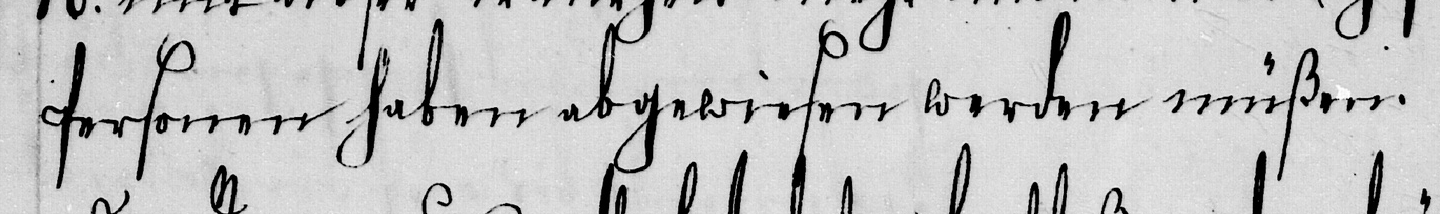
Personen haben abgewiesen werden müßen.
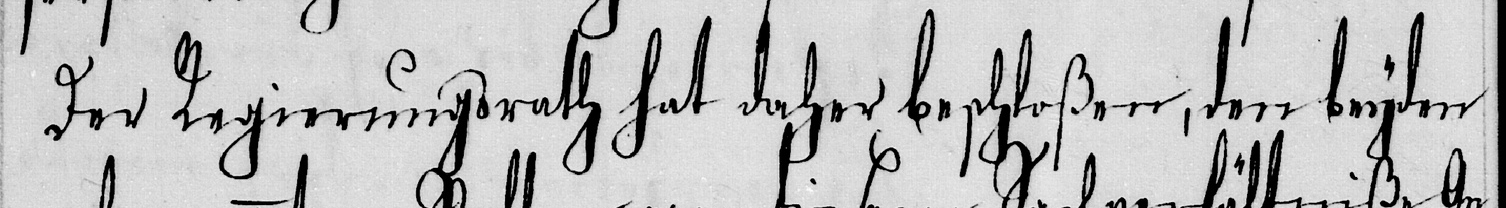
Der Regierungsrath hat daher beschloßen, den beyden
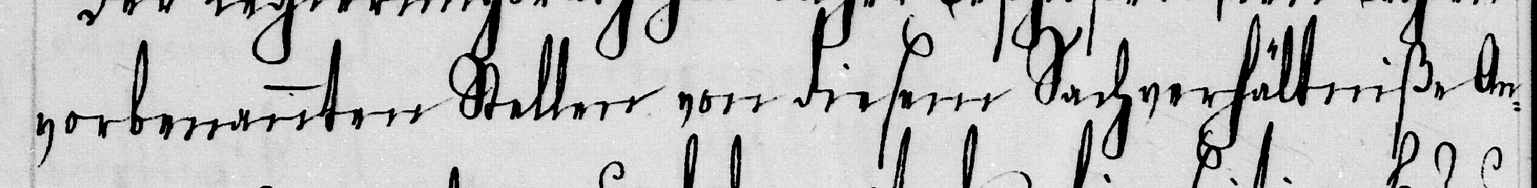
vorbenannten Stellen von diesem Sachverhältniße An¬
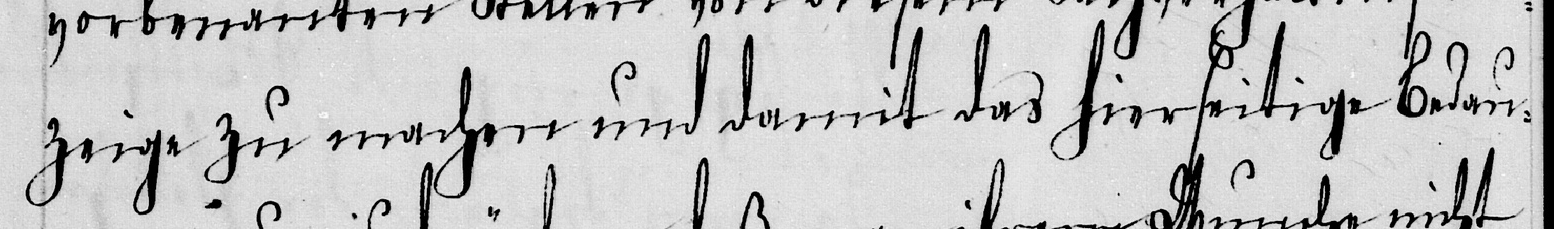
zeige zu machen und damit das hierseitige Bedau¬
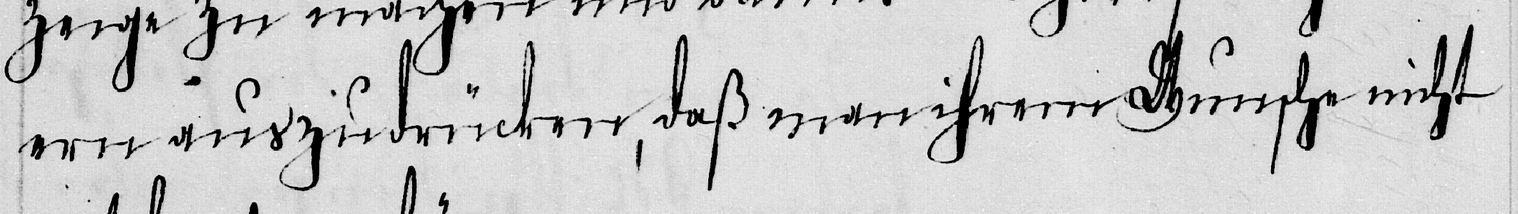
ern auszudrücken, daß man ihrem Wunsche nicht
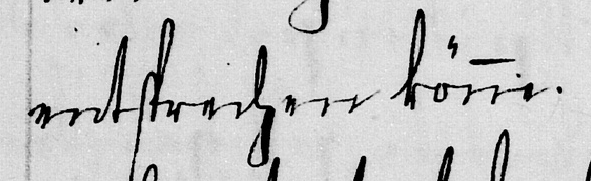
entsprechen könne.
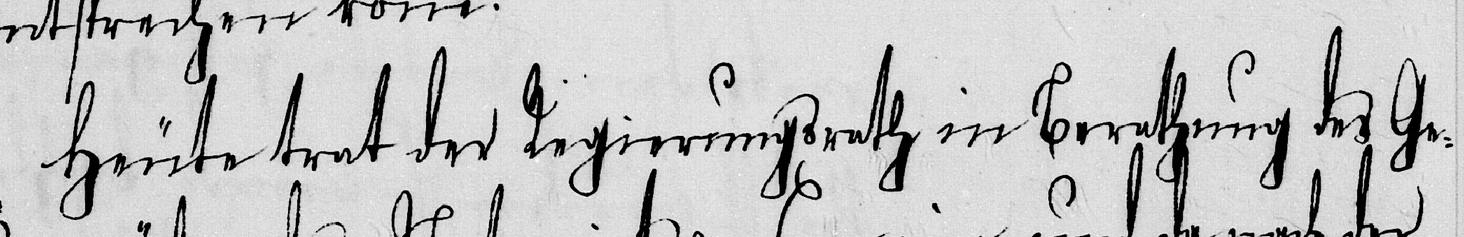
Heute trat der Regierungsrath in Berathung des G¬
